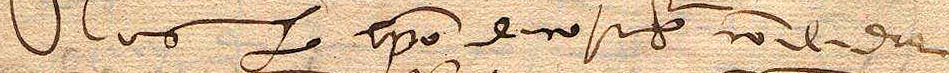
Nos ho bp̄o de coJmbra c̄ode dar
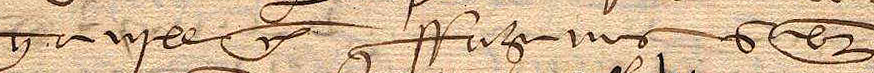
ganjll c̄ꝭ ffazemos sābr
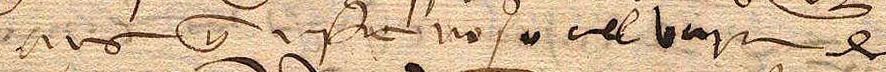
aos q̄ este noso alluara de
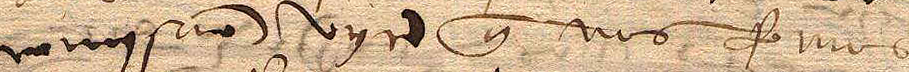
comjsão vyrē q̄ nos fomos
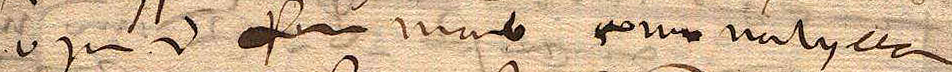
ora ēformado como na vylla
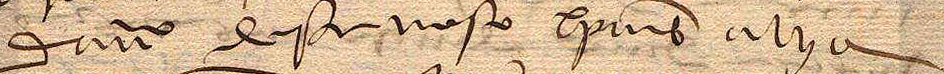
dauro deste noso bpādo avya
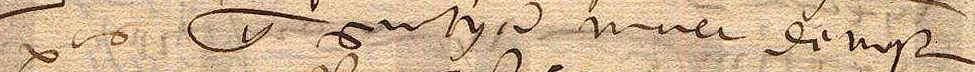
pas q̄ sentyā mall de nosa
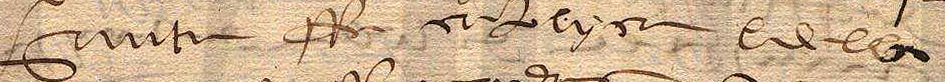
Santa ffe catolyca e dello
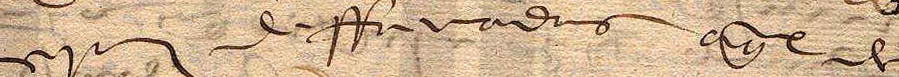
eram deffamadas a q̄l de
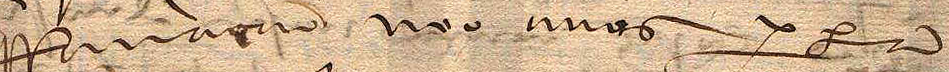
ffamacão ueo a nos ꝑ huā
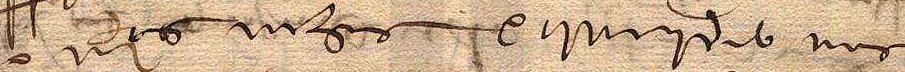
e mtas uezes e querēndo nos
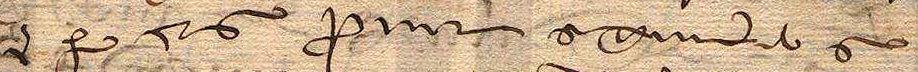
ē ho caso ꝓuer segūdo so
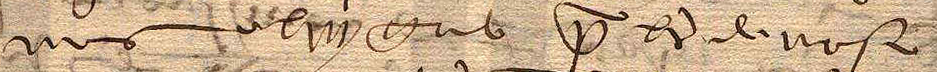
mos obrygado p̄o bē de noso
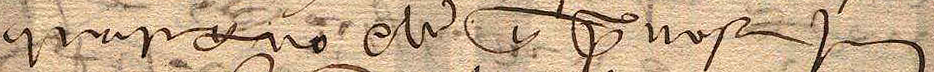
quareguo e vē q̄ p̄o nosa Jm
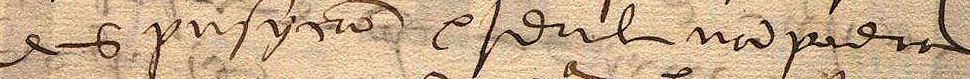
despusycão e Jdade nā podia
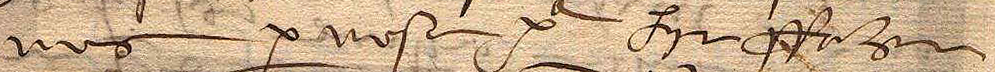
mos ꝑ nosa pa hyr ffazer
